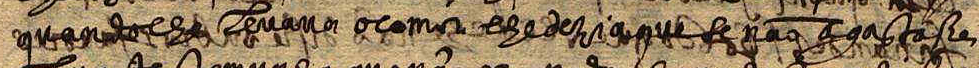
quando lhe Leuaua o comer lhe dezia que se não agastasse
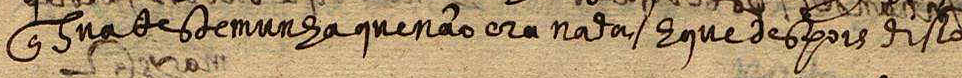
q̄ hua testemunha que não era nada / E que despois disso
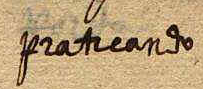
praticando
